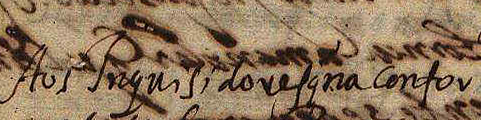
Aos Inquisidores q̄ na confor
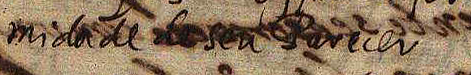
midade de seu Parecer
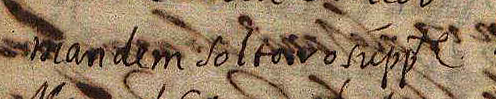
mandem soltar o sūppte
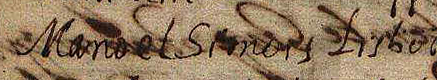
Manoel Simois Lisboa
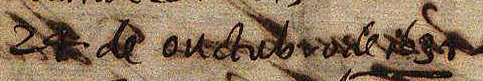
24 de ouctubro de i634
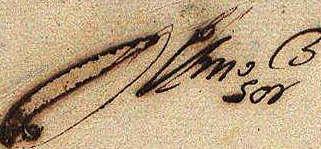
Jllmo sor̄
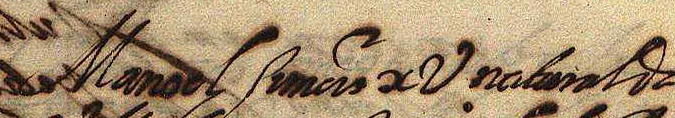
Manoel Simoĩs xV natural da
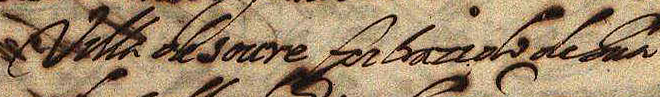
Villa de soure, foi trazido de huā
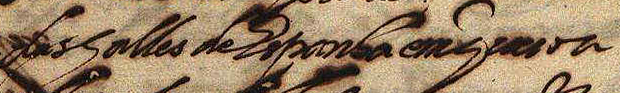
das Galles de Espanha em q̄ ueio a
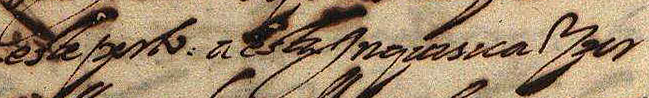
este porto. a esta Jnquisiçaõ por
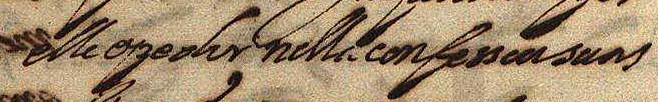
elle o pedir nella confessou suas
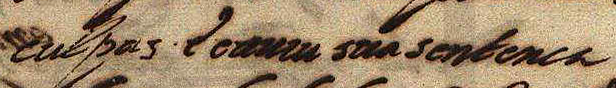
culpas. e ouuiu sua sentença
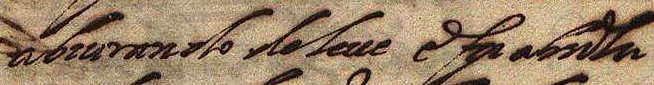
abiurando de leue e foi absolu
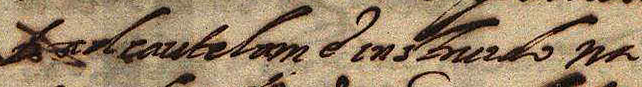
to ad cautelam e instruido na
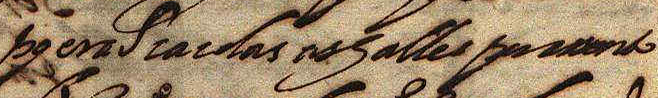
po eraõ saidas as Galles por assento
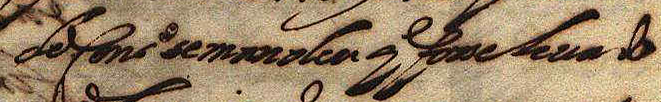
do Conso se mandou q̄ fosse leuado
